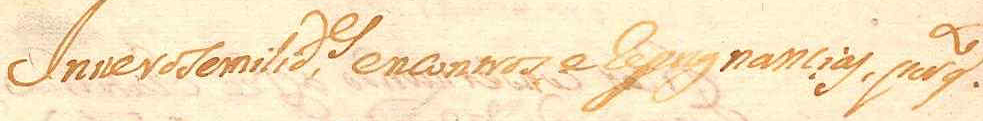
Inuerosemilid̄.es encontros e Repugnancias, porq̄to.
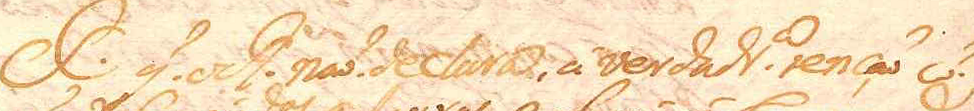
P. q̄. o R. naõ declara, a verdadr.a tençaõ cō
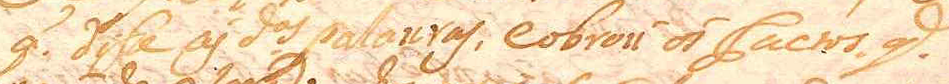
q̄. disse as d.as palauras, e obrou os factos q̄
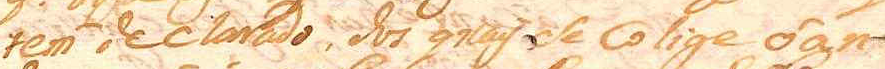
tem declarado, dos quais se colige o an
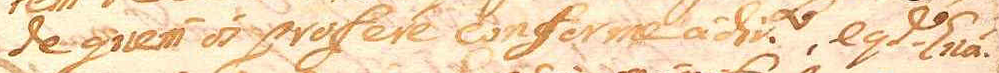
de quem os profere conforme a dir.to, e qdo huā
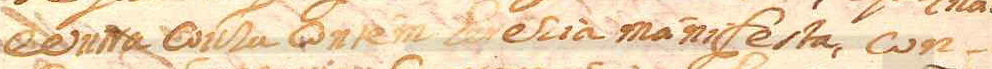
e outra couza contem heresia manifesta, con
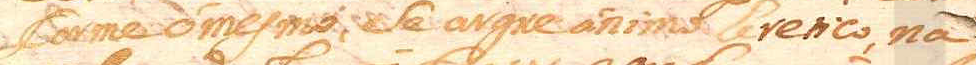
forme o mesmo, se argue ánimo heretico, na
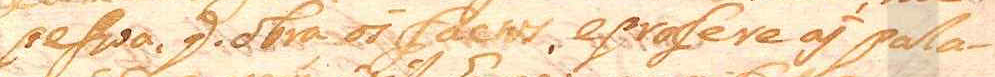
pessoa q̄. obra os factos, e profere as pala
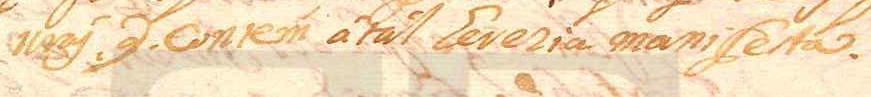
uras, q̄ contem a tal herezia manifesta.
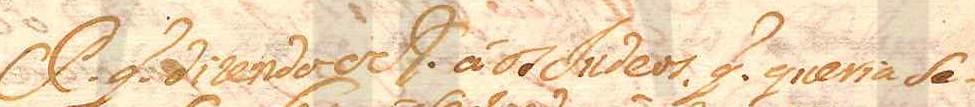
P. q̄. dizendo o R. áos Iudeos. q̄ queria se
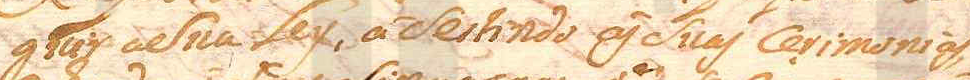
guir a sua Ley, asestindo as suas cerimonias,
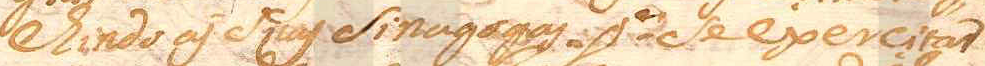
e hindo as Suas sinagogas. pa se exercitar
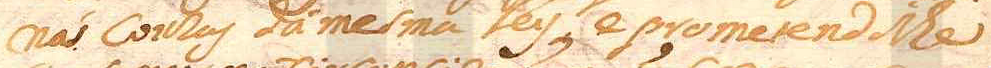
nas couzas da mesma ley, e prometendolhe
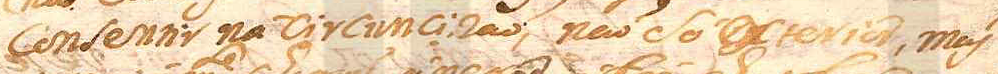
consentir na circuncizaõ; naõ so exterior, mas
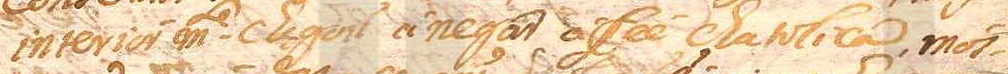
interiorm.te chegou a negar a feé chatolica, mos
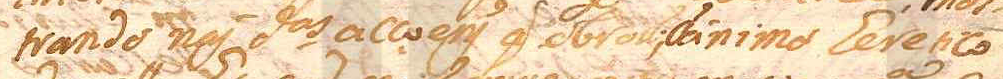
trando nas d.as acçoens q̄ obrou o animo heretico
